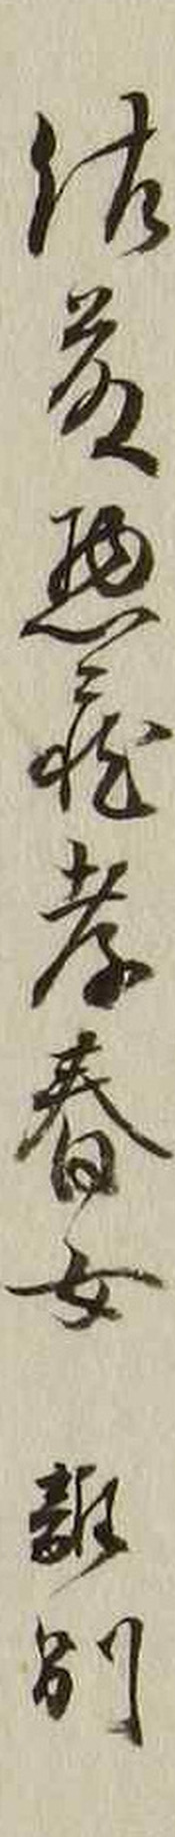佐藤惣蔵孝春女離別
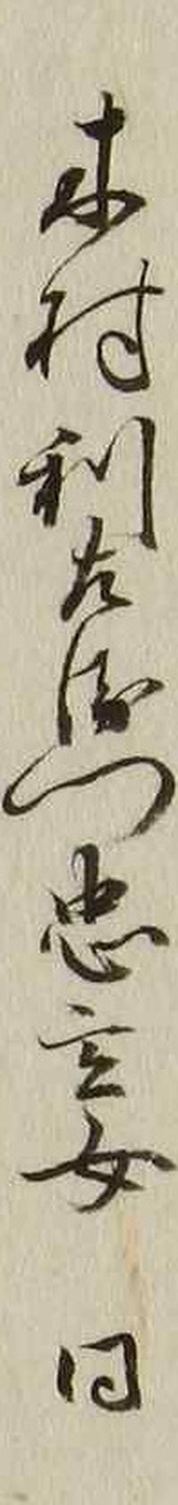木村利左衛門忠玄女同
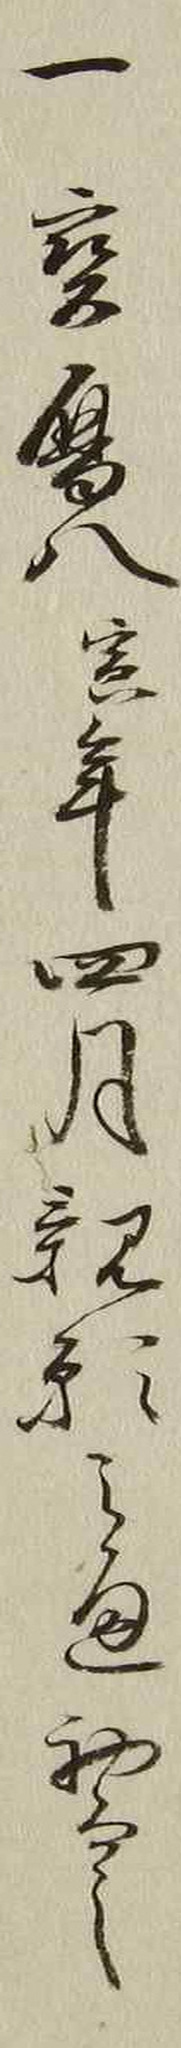一宝暦八寅年四月親願之通初而之
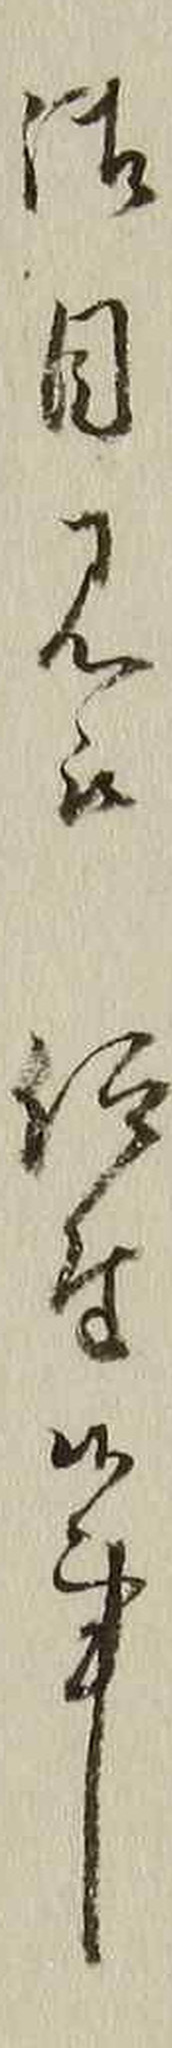御目見被仰付候事
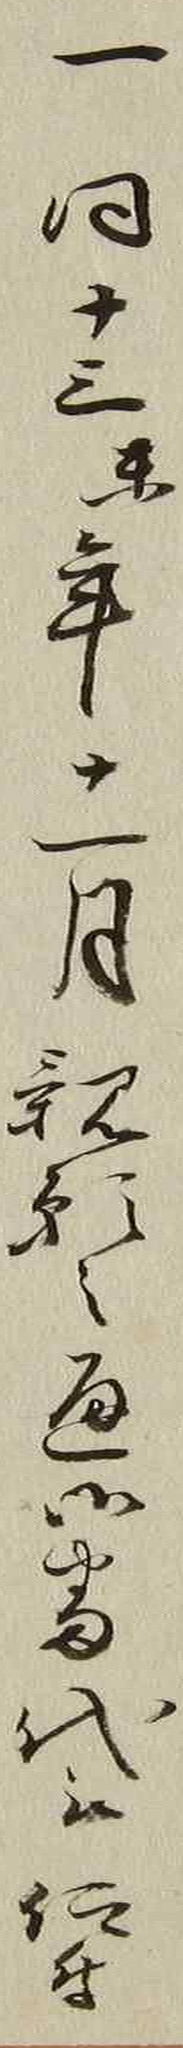一同十三未年十一月親願之通御番代被仰付
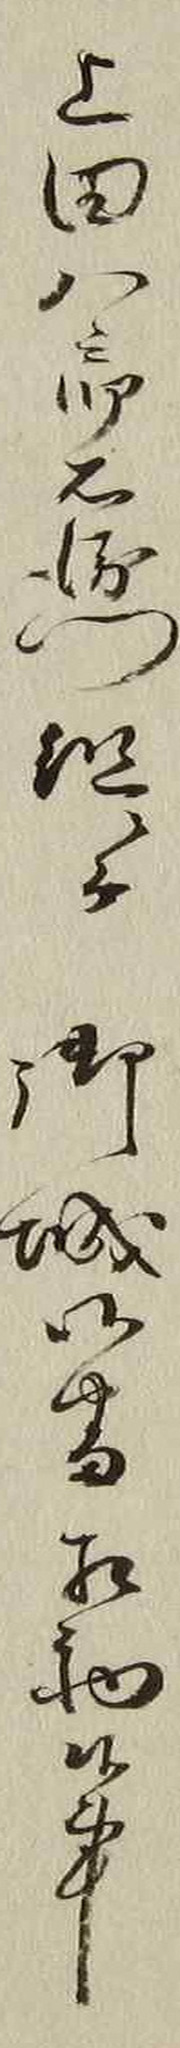上田八郎右衛門組ニ而御城御番相勤候事
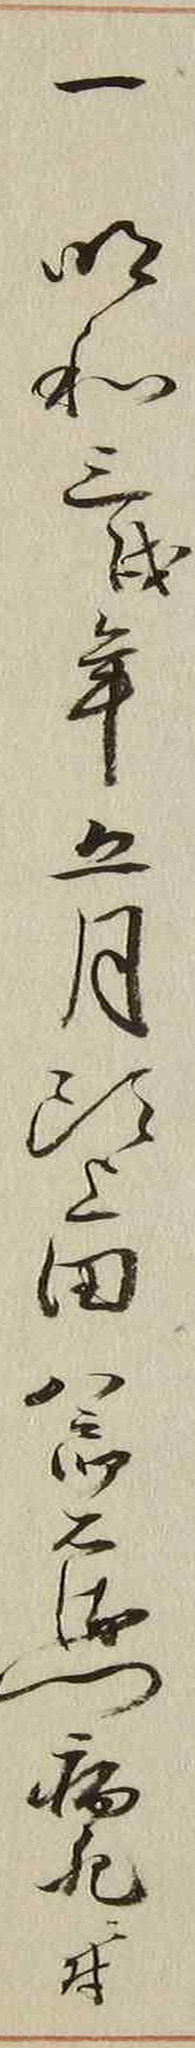一明和三戌年五月頭上田八郎右衛門病死ニ付
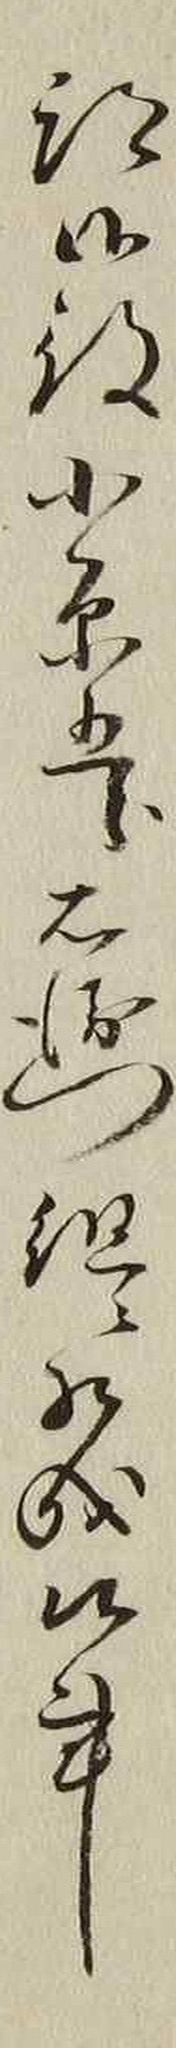跡御役小原五郎右衛門組ニ相成候事
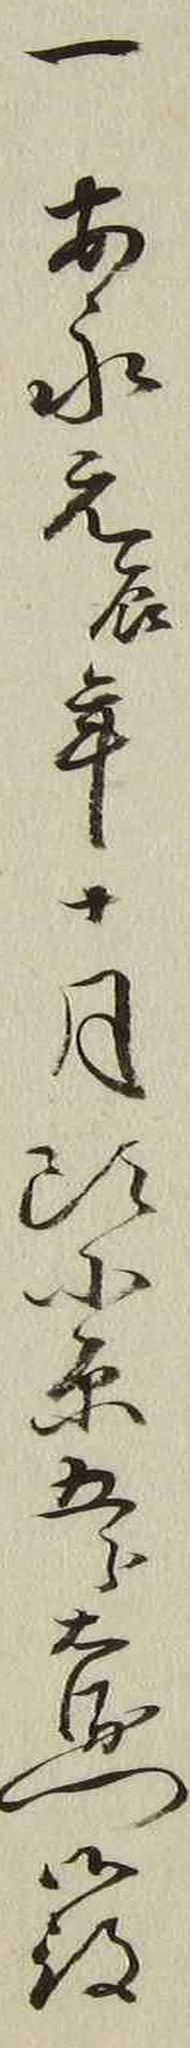一安永元辰年十月頭小原五郎右衛門御役
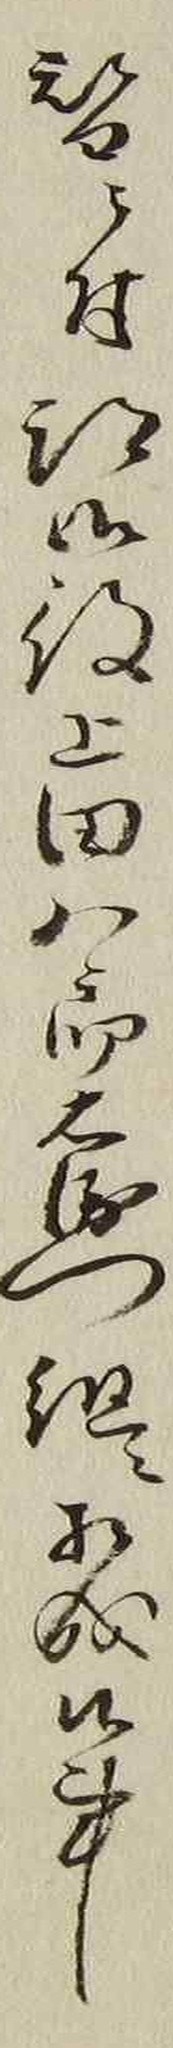替ニ付跡御役上田八郎右衛門組ニ相成候事
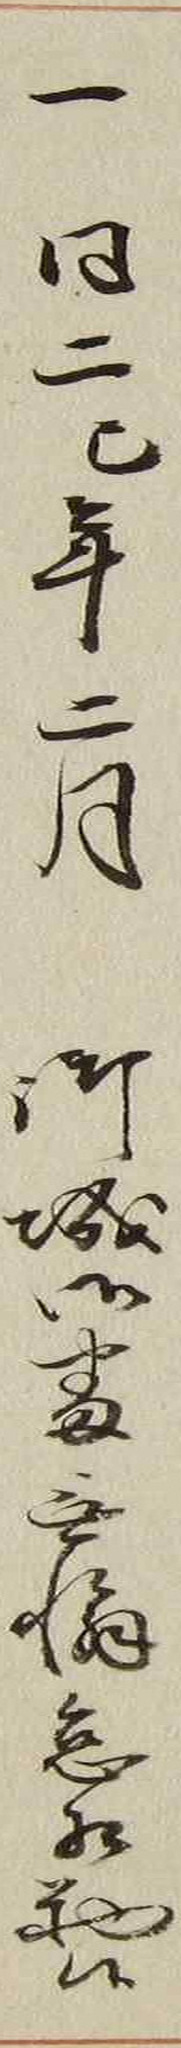一同二巳年二月御城御番無懈怠相勤候
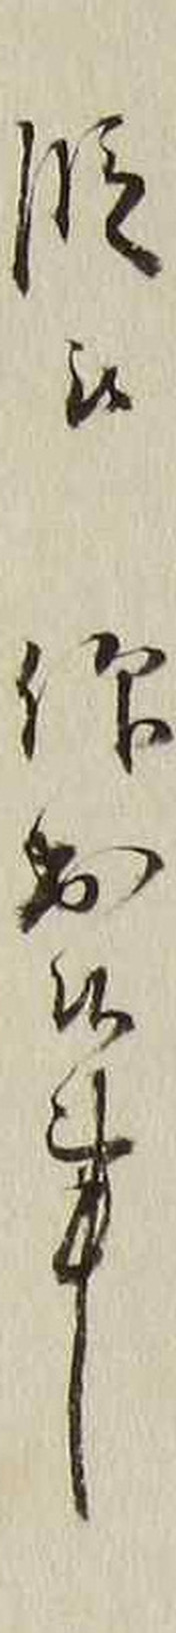段被仰出候事
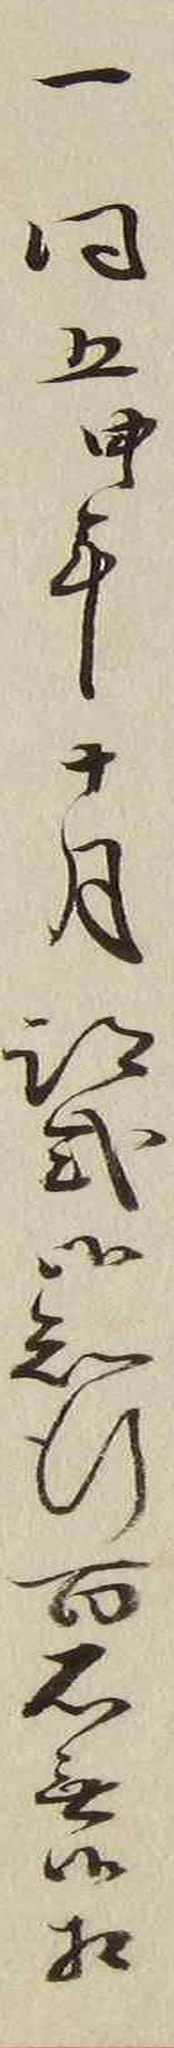一同五申年十月跡式御知行百石無御相
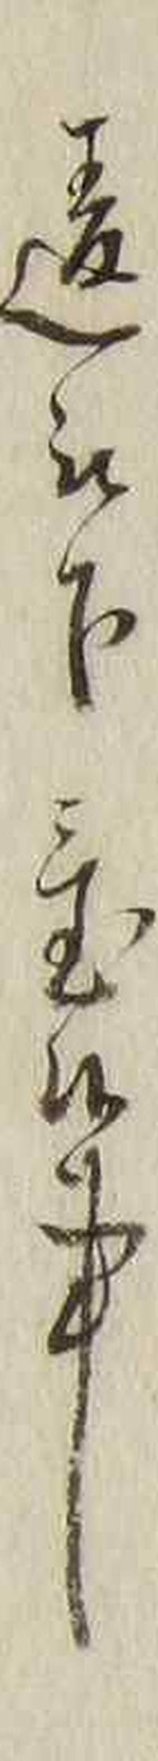違被下置候事

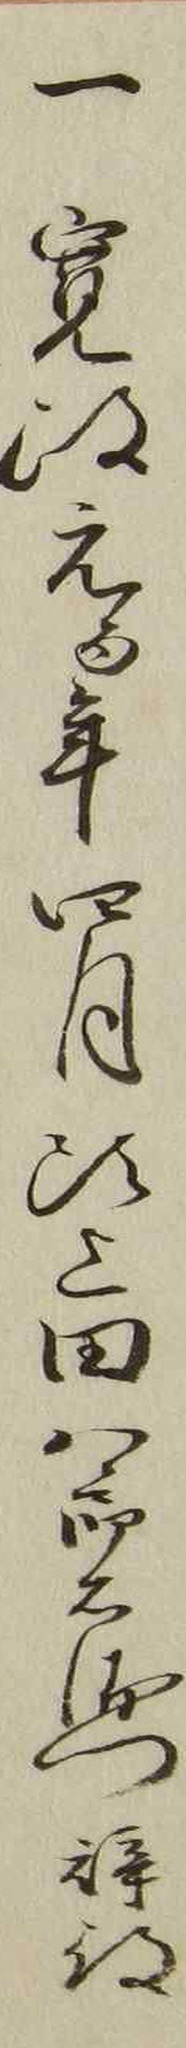一寛政元酉年四月頭上田八郎右衛門辞役
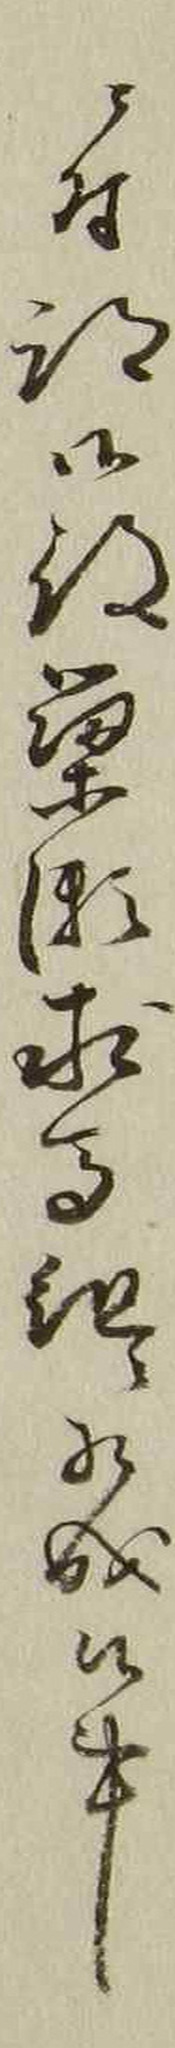ニ付跡御役簗瀬求馬組ニ相成候事
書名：諸士系譜　巻之26　い之部26
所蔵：会津若松市立会津図書館
